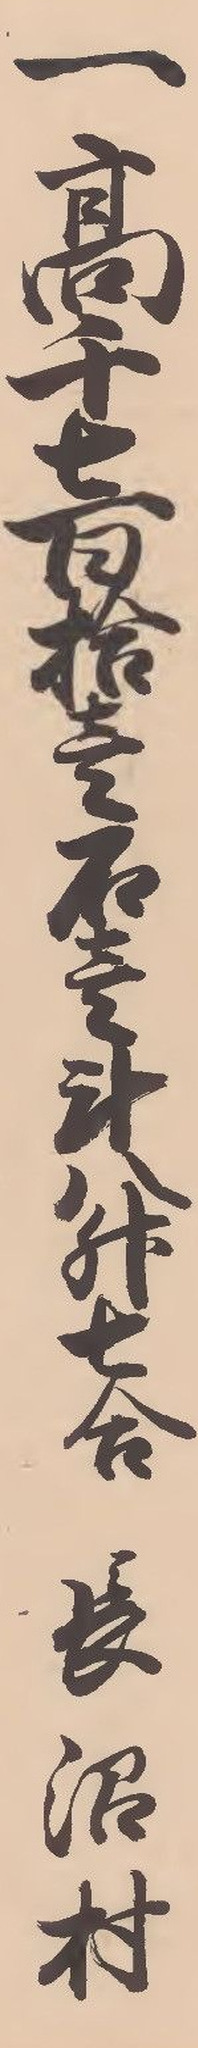一高千七百拾壱石壱斗八升七合長沼村
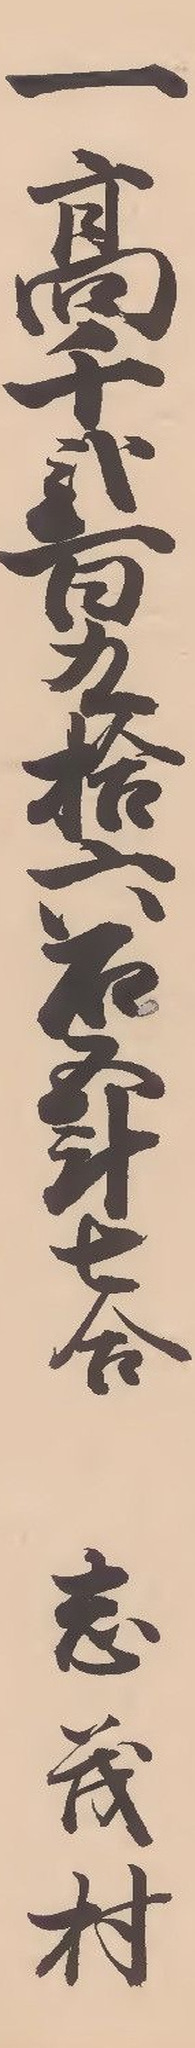一高千弐百九拾六石五斗七合志茂村
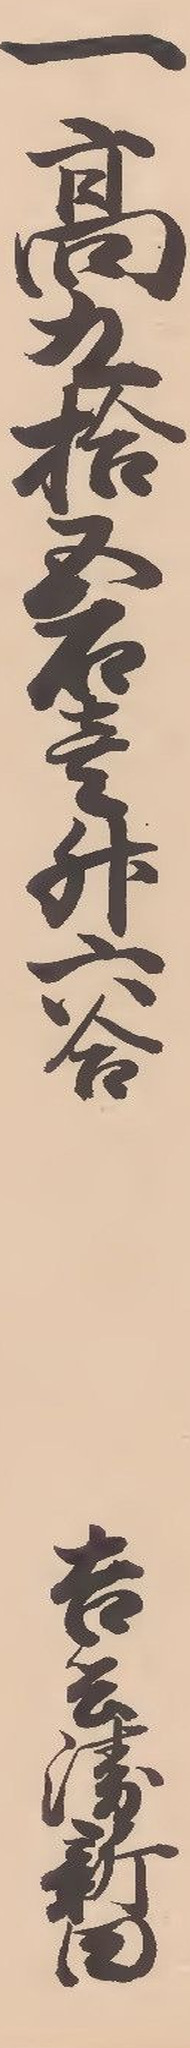一高九拾五石壱升六合吉兵衛新田
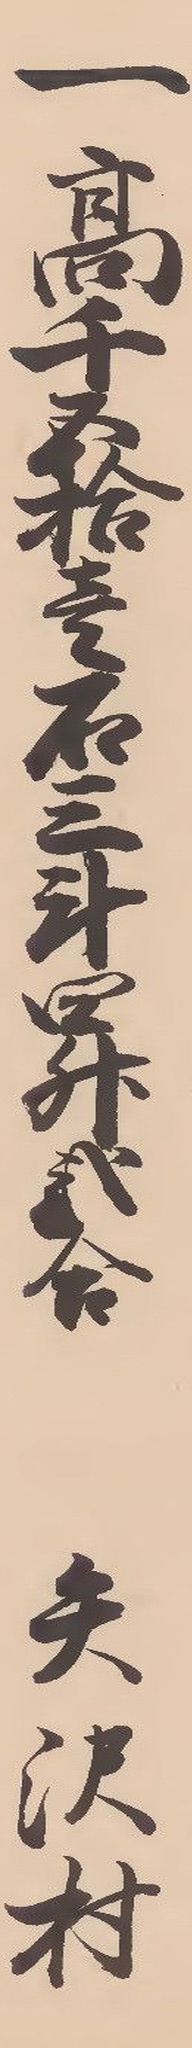一高千五拾壱石三斗四升弐合矢沢村
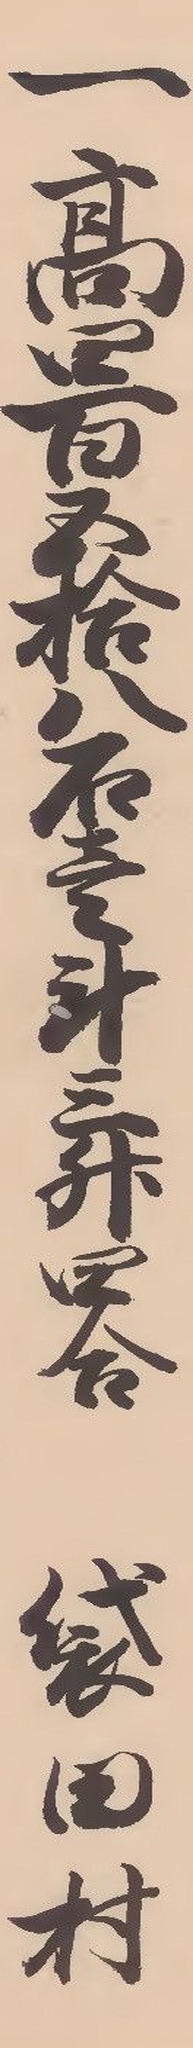一高四百五拾八石壱斗三升四合袋田村
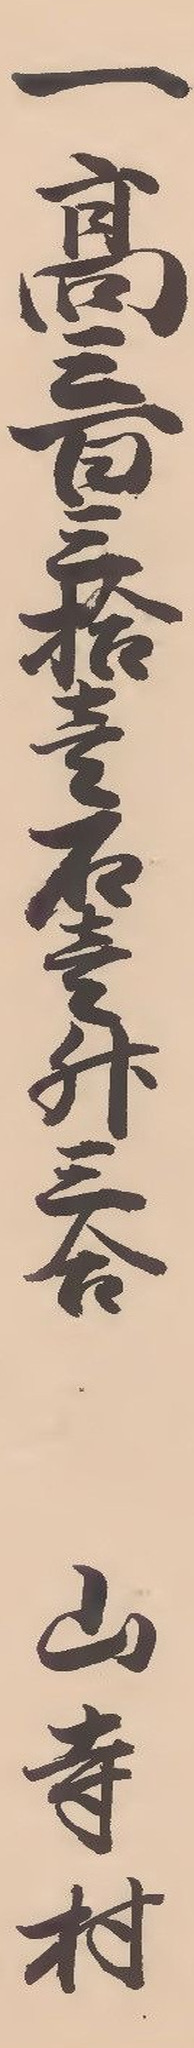一高三百三拾壱石壱升三合山寺村
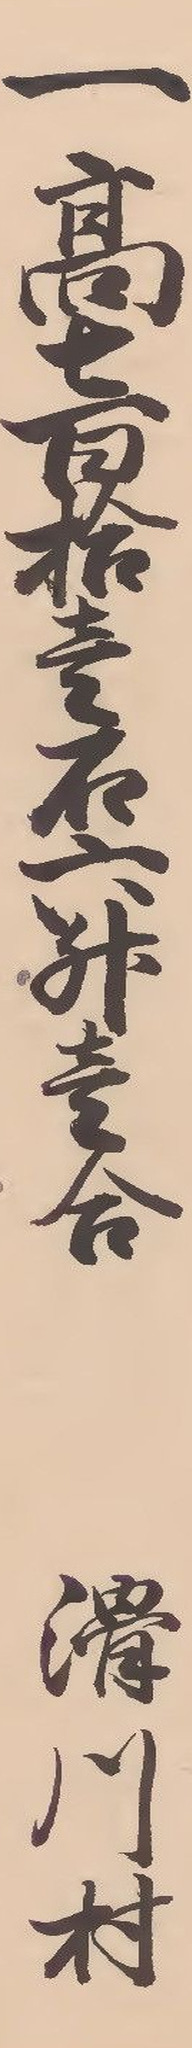一高七百拾壱石六升壱合滑川村

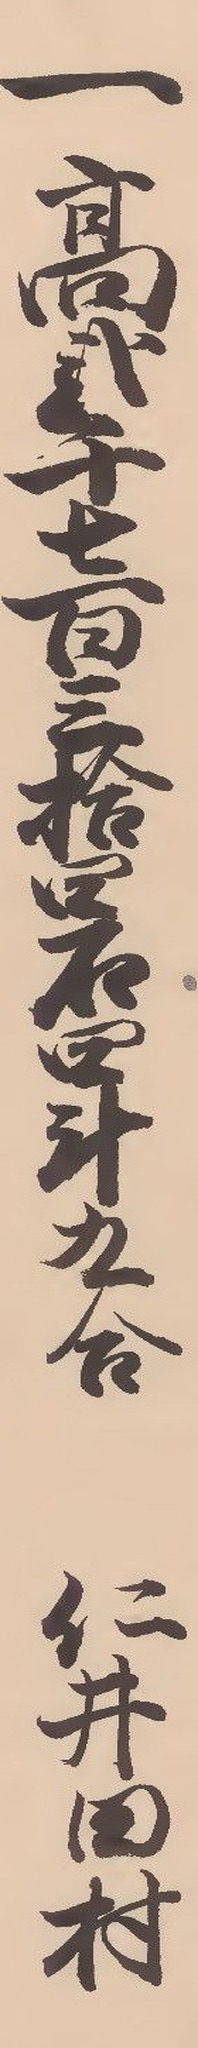一高弐千七百三拾四石四斗九合仁井田村
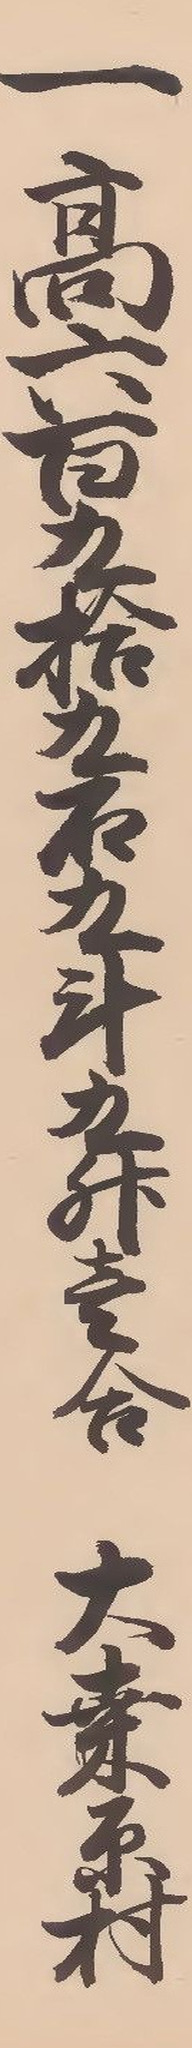一高六百九拾九石九斗九升壱合大桑原村
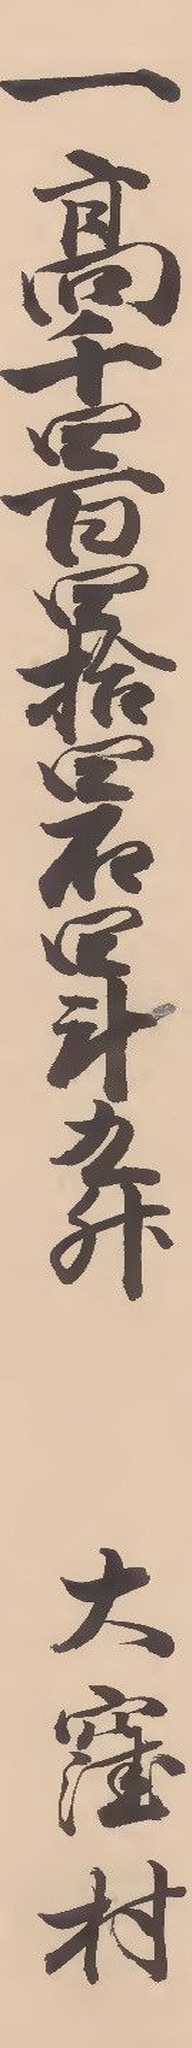一高千四百四拾四石四斗九升大窪村
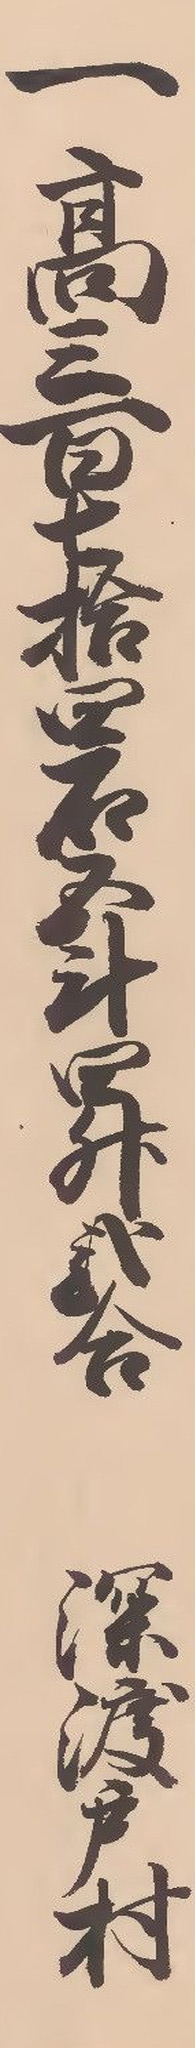一高三百七拾四石五斗四升弐合深渡戸村
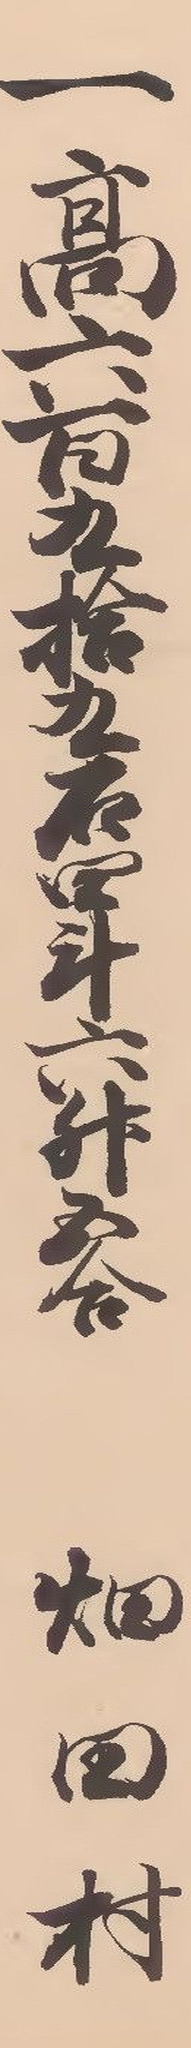一高六百九拾九石四斗六升五合畑田村
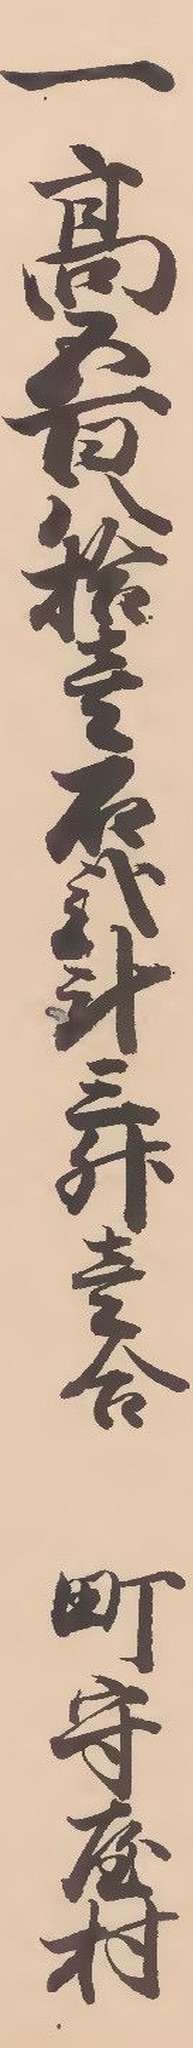一高五百八拾壱石弐斗三升壱合町守屋村
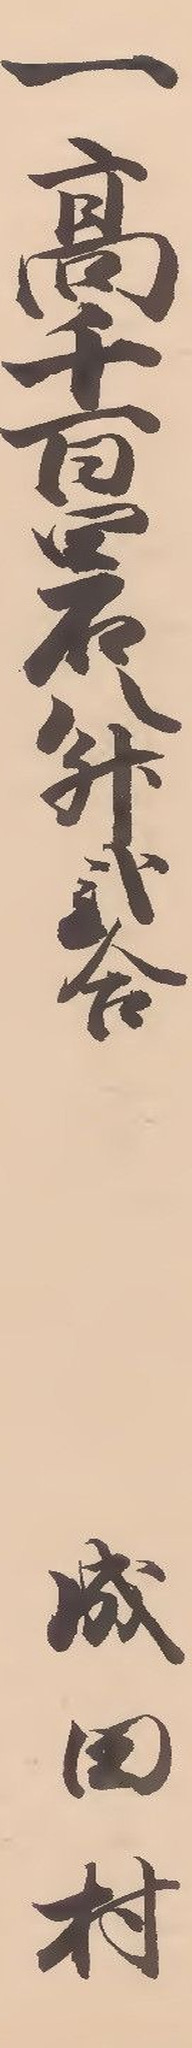一高千百四石八升弐合成田村
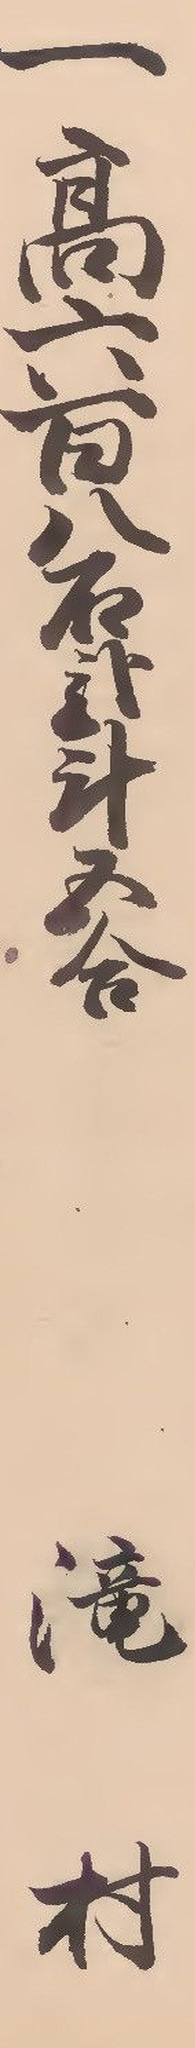一高六百八石弐斗五合滝村

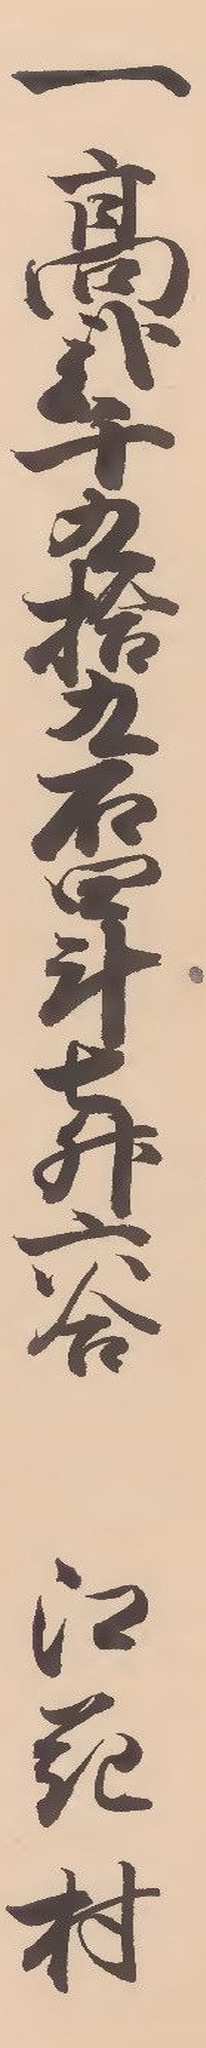一高弐千九拾九石四斗七升六合江花村
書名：陸奥国郷帳　２
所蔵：国立公文書館 National Archives of Japan
